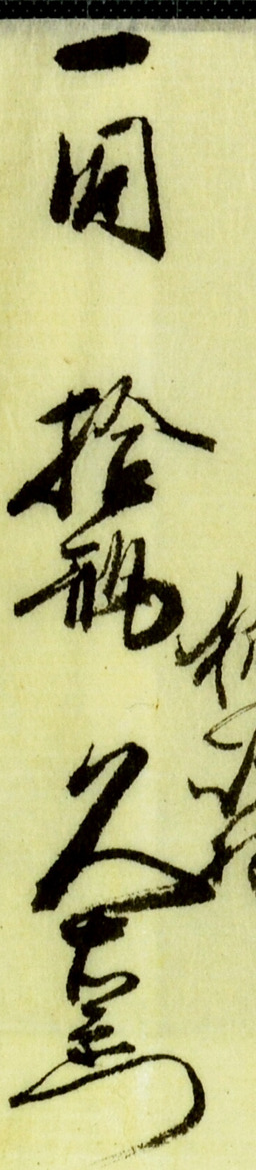一同拾瓶久右衛門

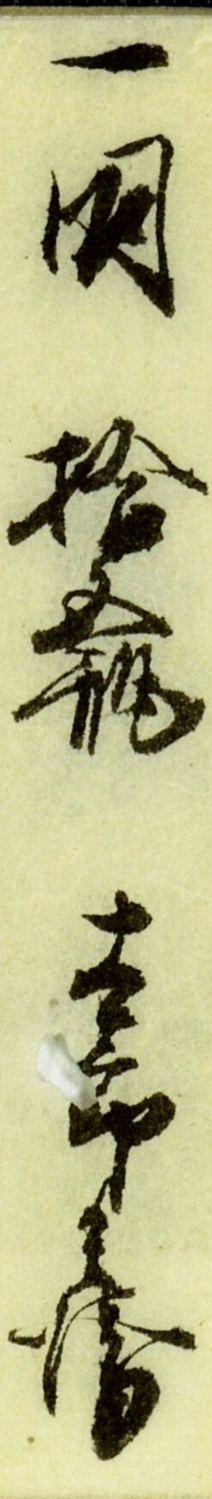一同拾五瓶太郎兵衛
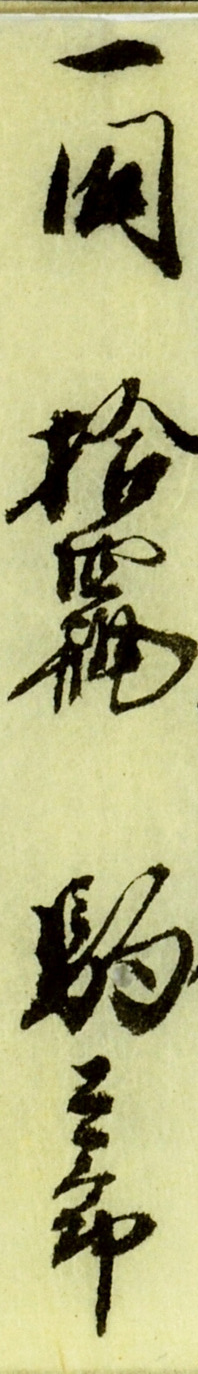一同拾四瓶駒太郎
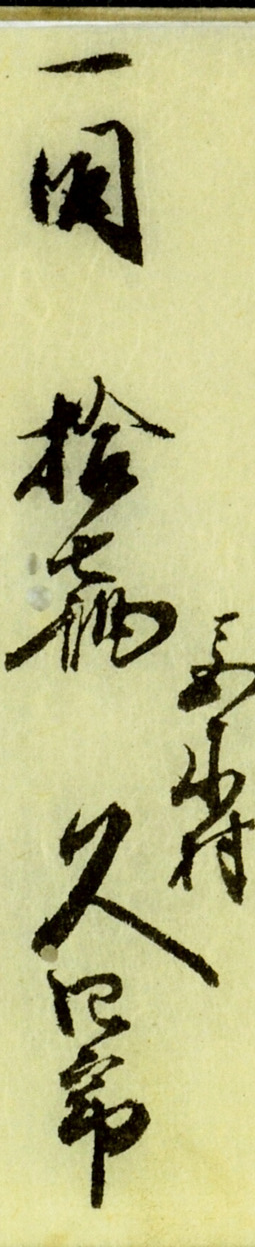一同拾七瓶久四郎
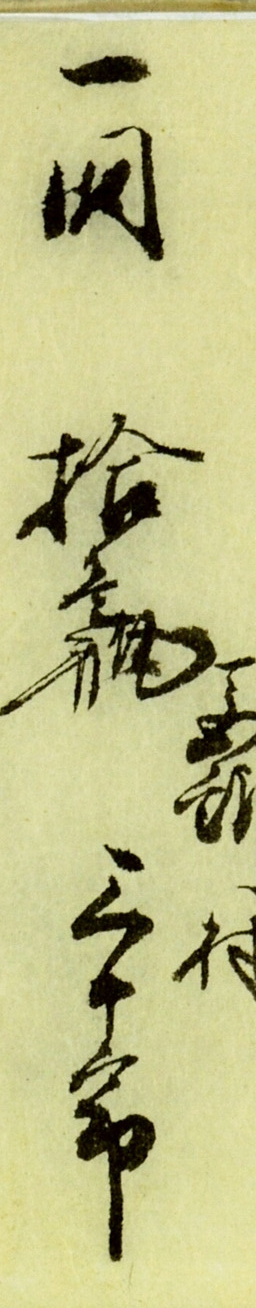一同拾壱瓶三十郎
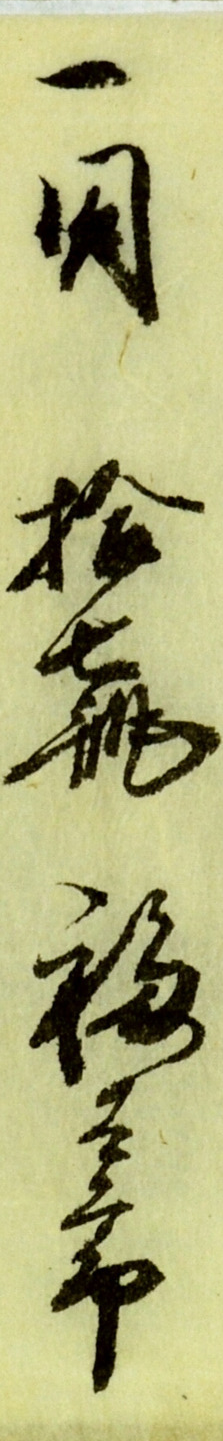一同拾七瓶福太郎

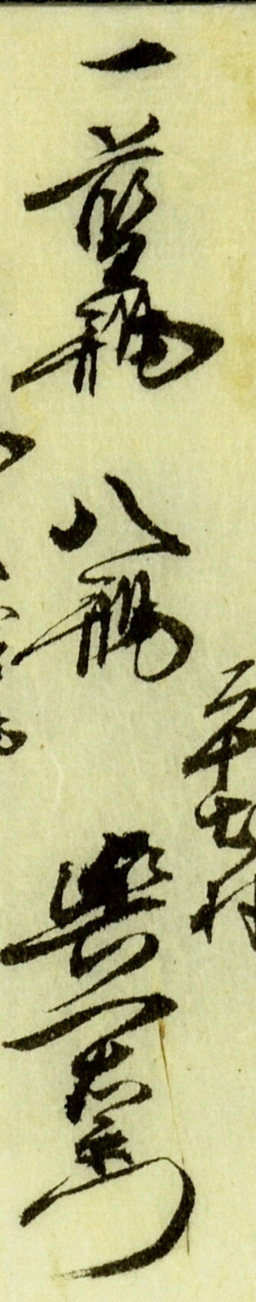一藍瓶八瓶与一右衛門
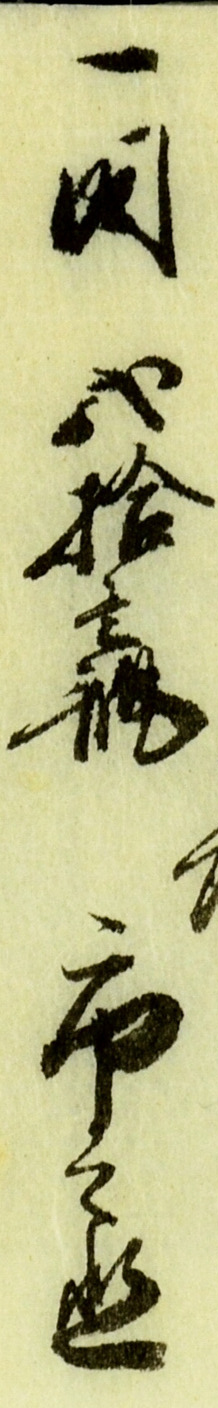一同弐拾壱瓶市之烝
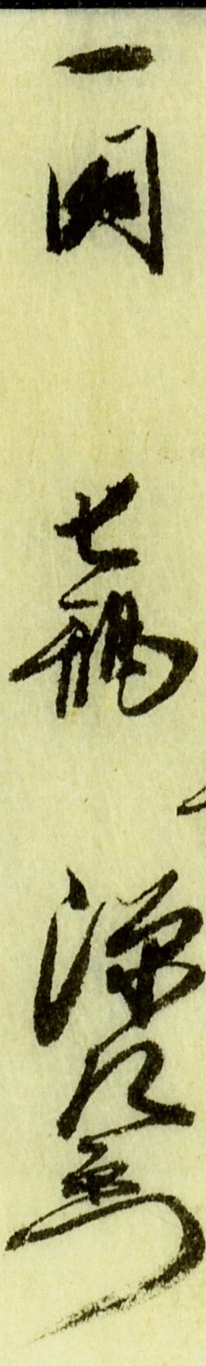一同七瓶源左衛門
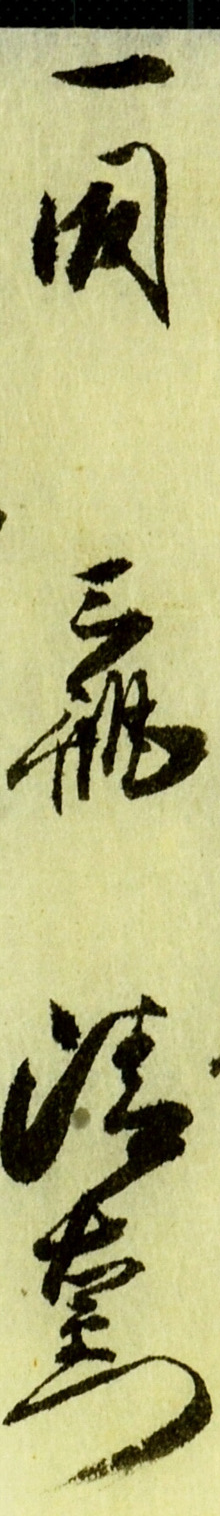一同三瓶清右衛門
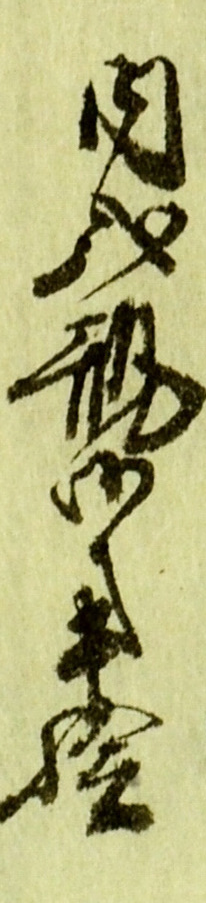内弐瓶御用捨
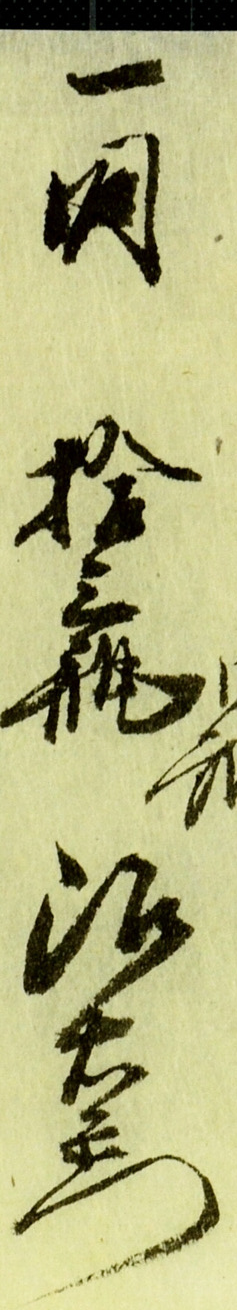一同拾三瓶治右衛門
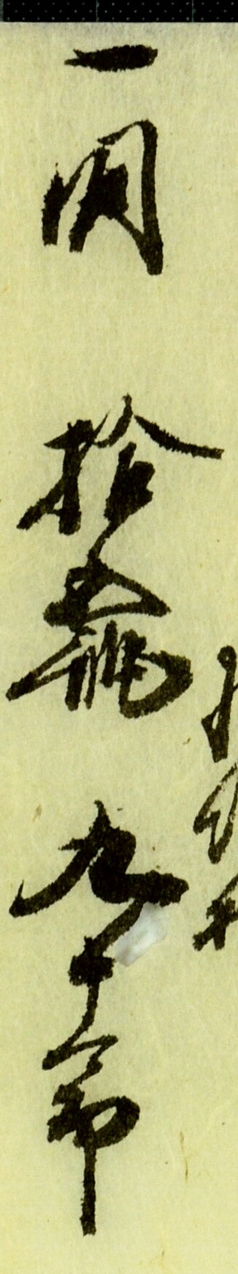一同拾五瓶九十郎
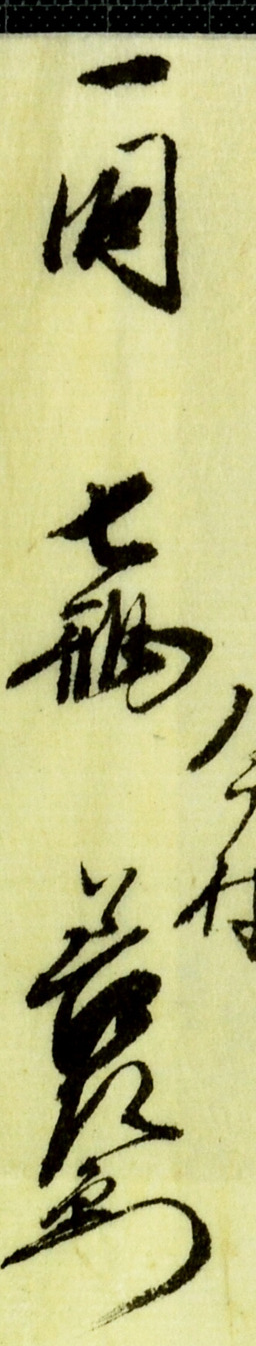一同七瓶善左衛門

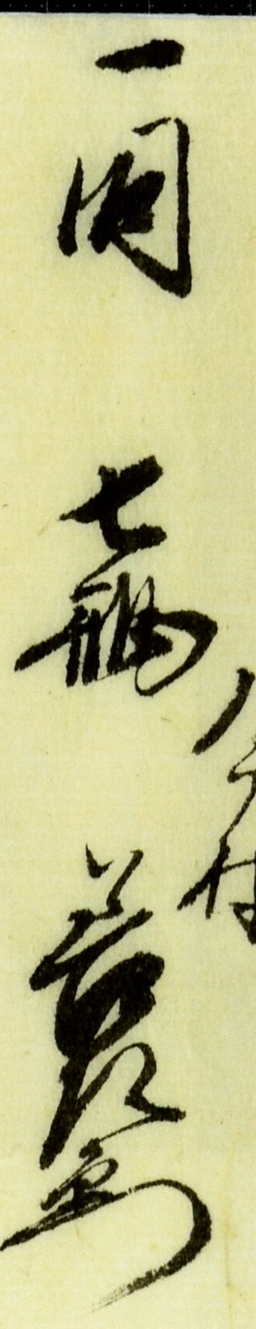一同七瓶五左衛門
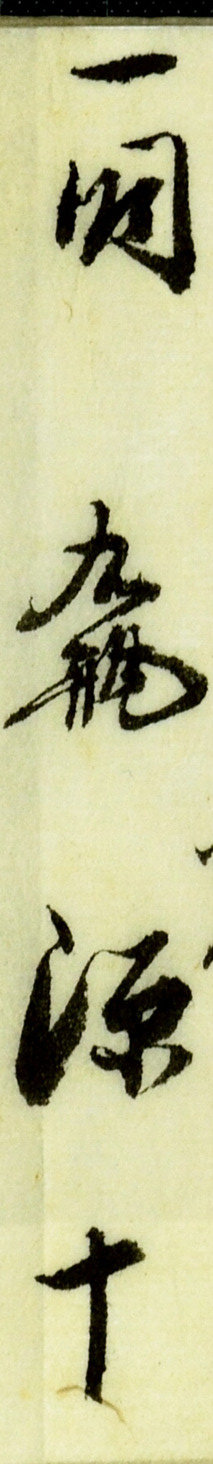一同九瓶源十
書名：御領分中御領分中紺屋藍瓶員数御改帳
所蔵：伊那市立高遠町図書館・合同会社AMANE
